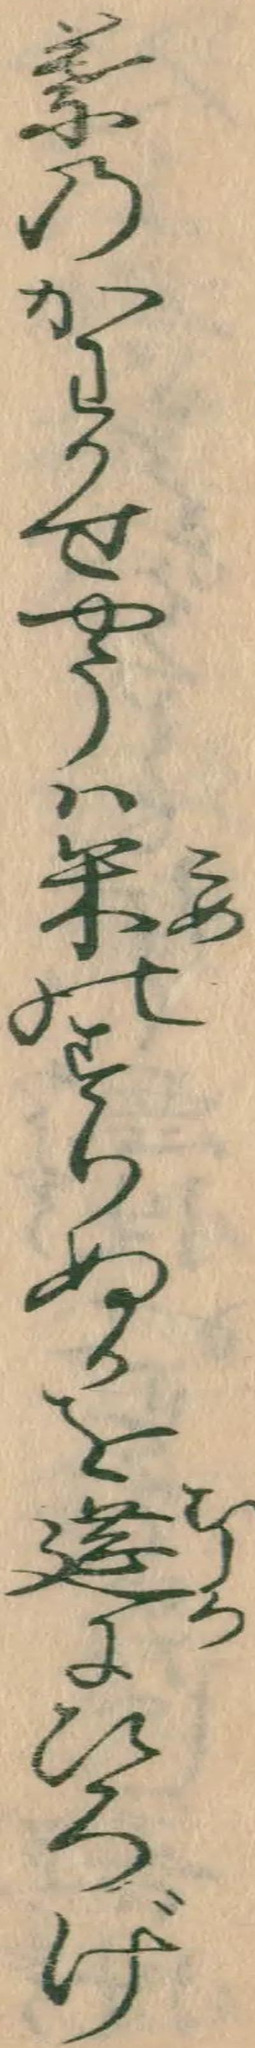葉のかわかせやうは米のすりぬかを筵にひろげ
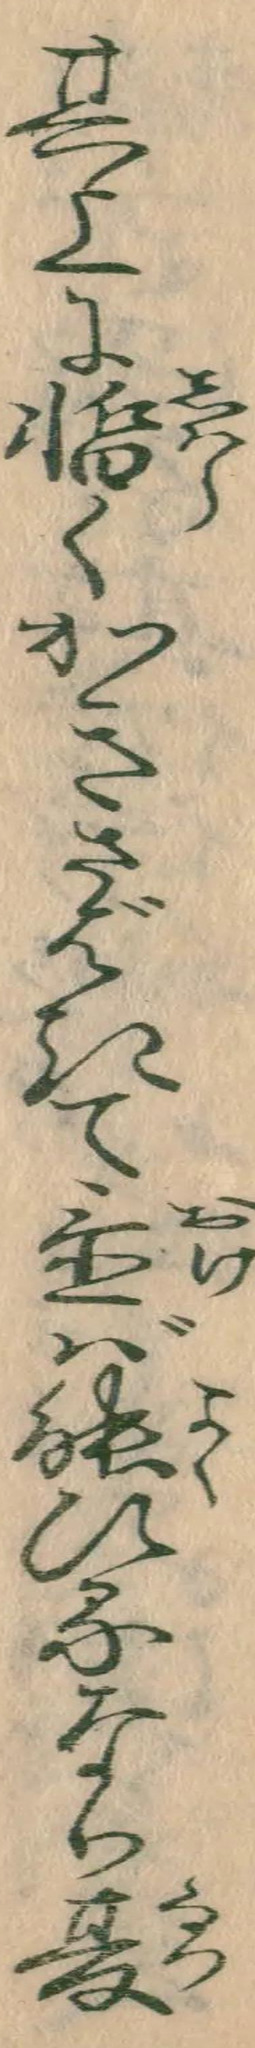其上に暫くかきさばきて置ば能ひるなり夏
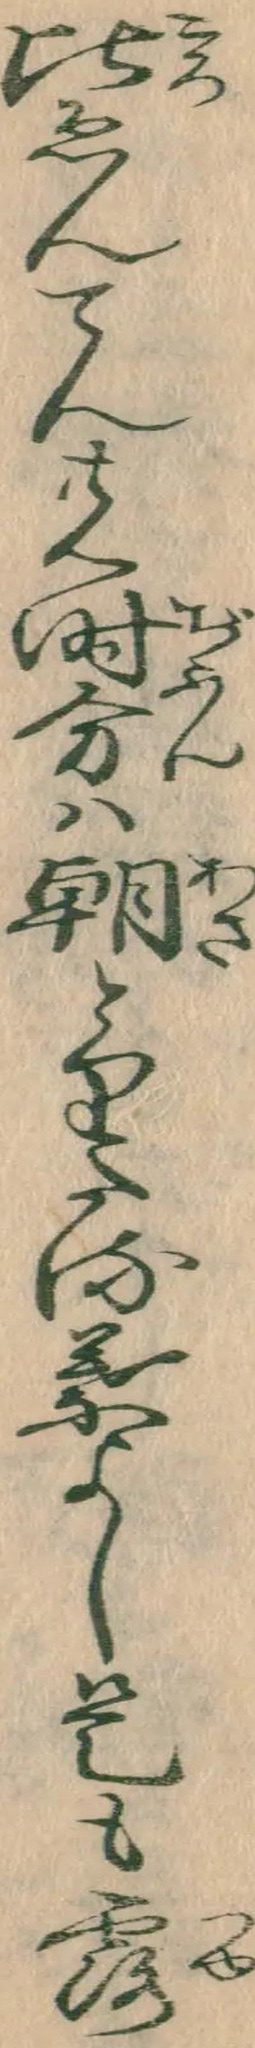比ゑんてんの時分は朝とりたる葉よし是も露
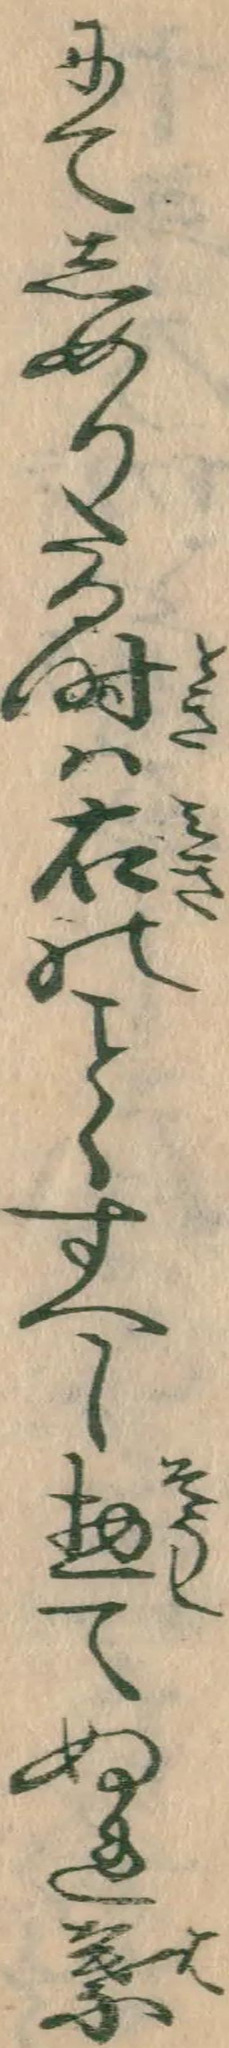にてしめりたる時は右のことくすへし惣てぬれ葉
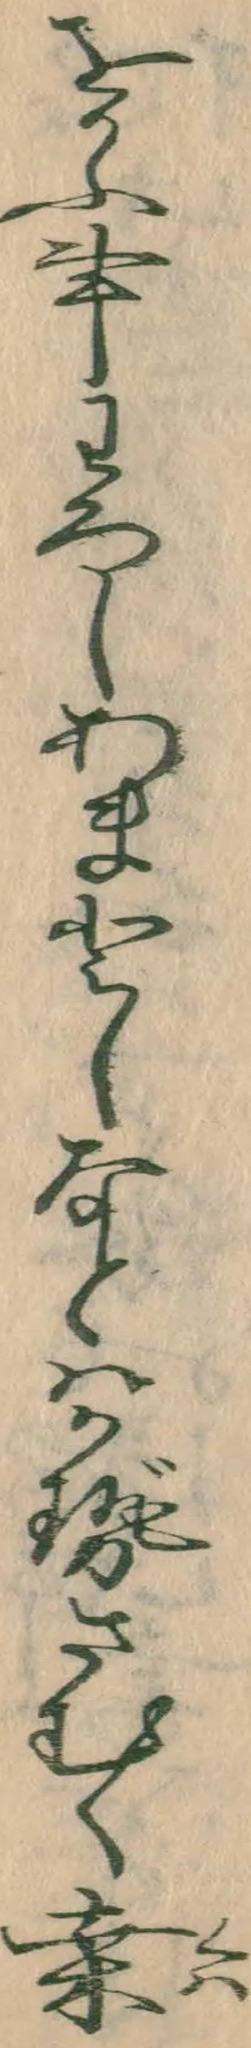をかふ事わろしあまとしなとはかぜさむく桑
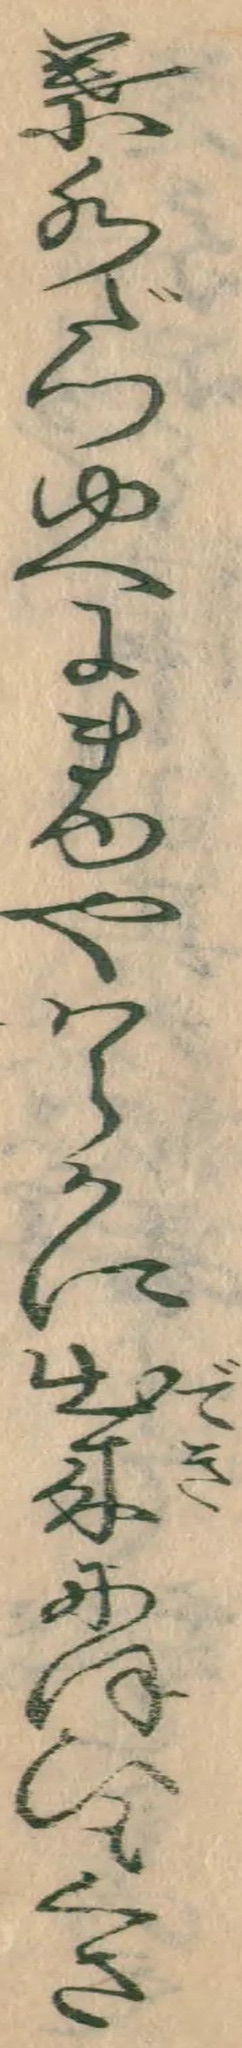葉水だつゆへにまゆやはらかに出来にほひもくさ
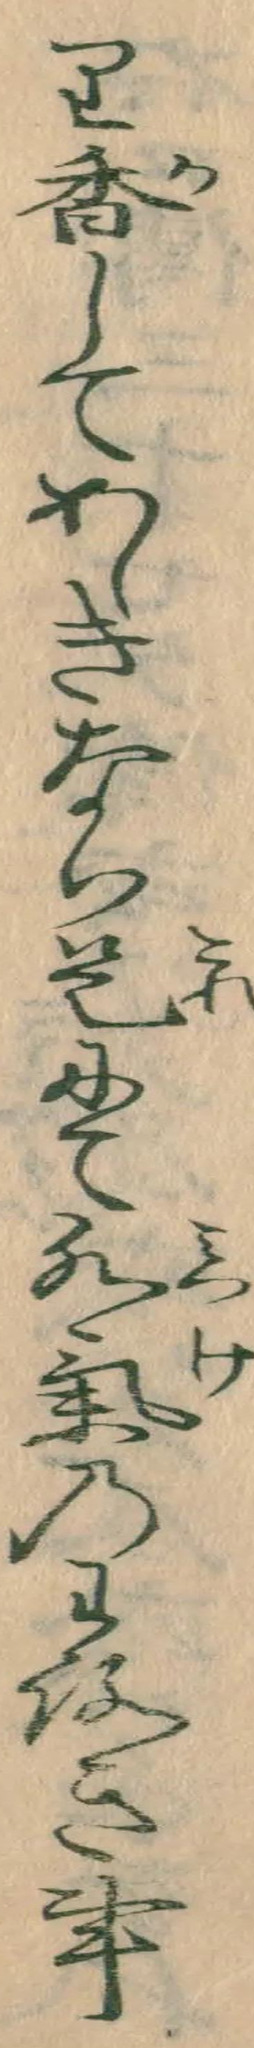り香してあしきなり是にて水気のわろき事
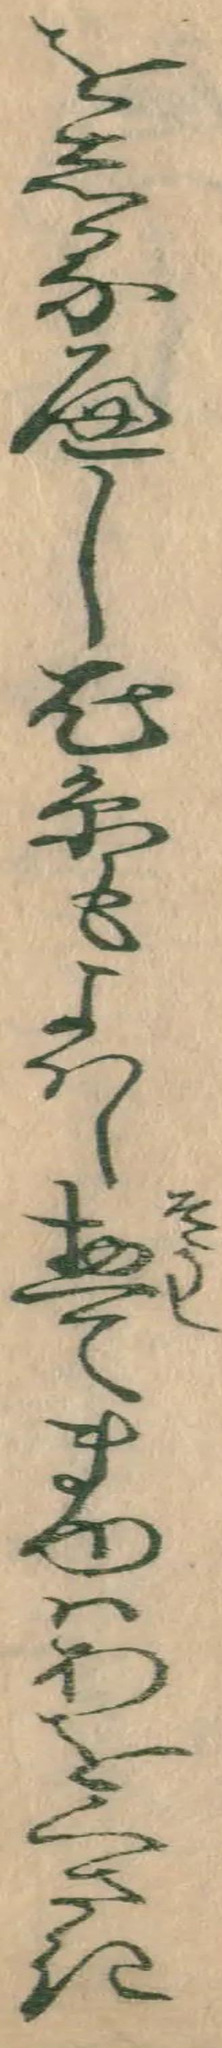をしるへし尤糸もよはし惣てまゆはあをくさき
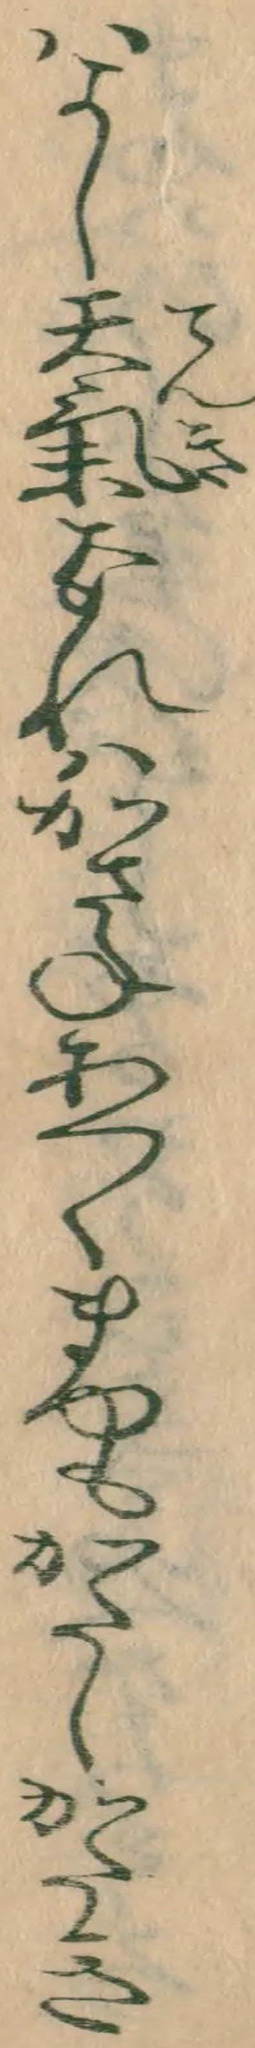はよし天気なれはかさねあつくまゆもかたしかたき

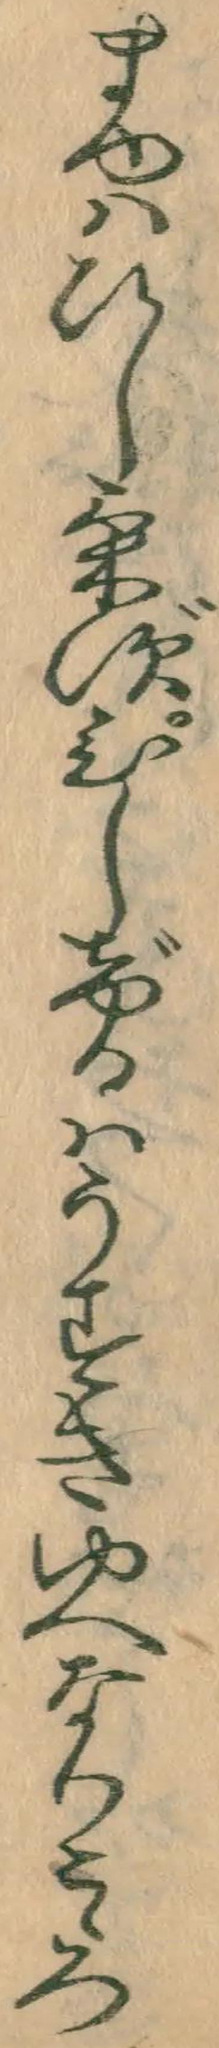まゆはひしけず。ひしげるはうすきゆへなりこゝろ
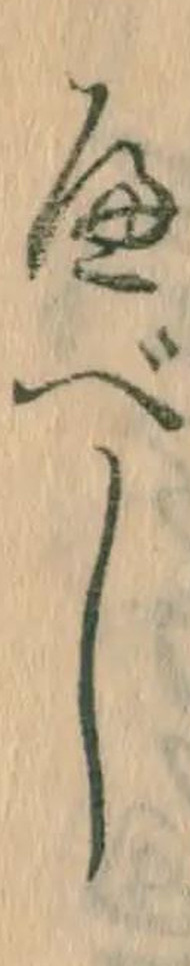へべし
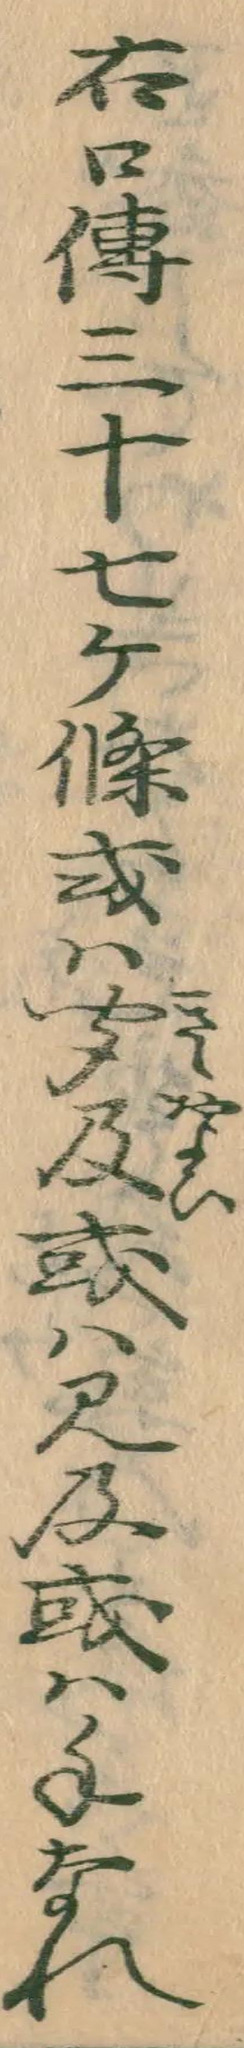右口伝三十七ケ條或は聞及或は見及或は手なれ
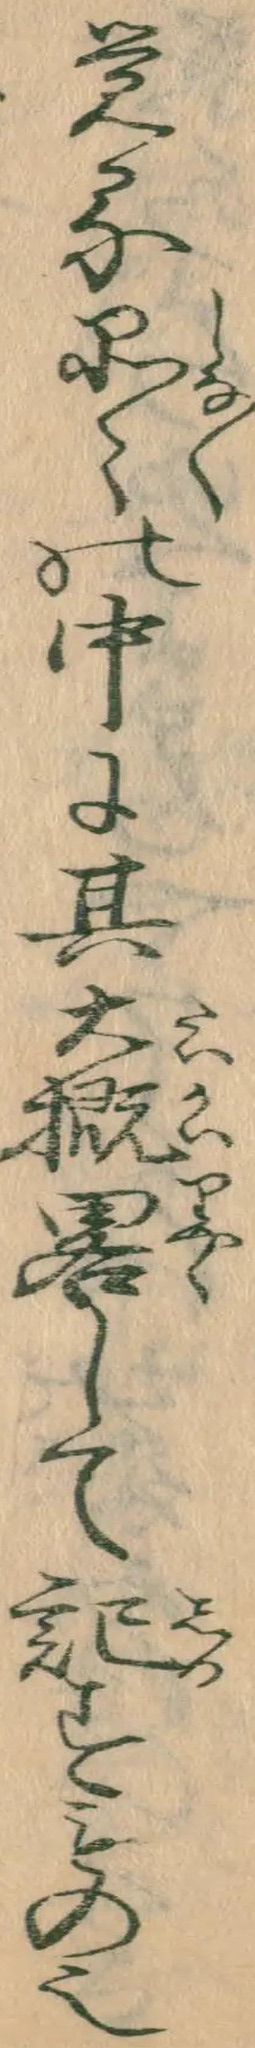覚る品々の中に其大概略して記すもの也
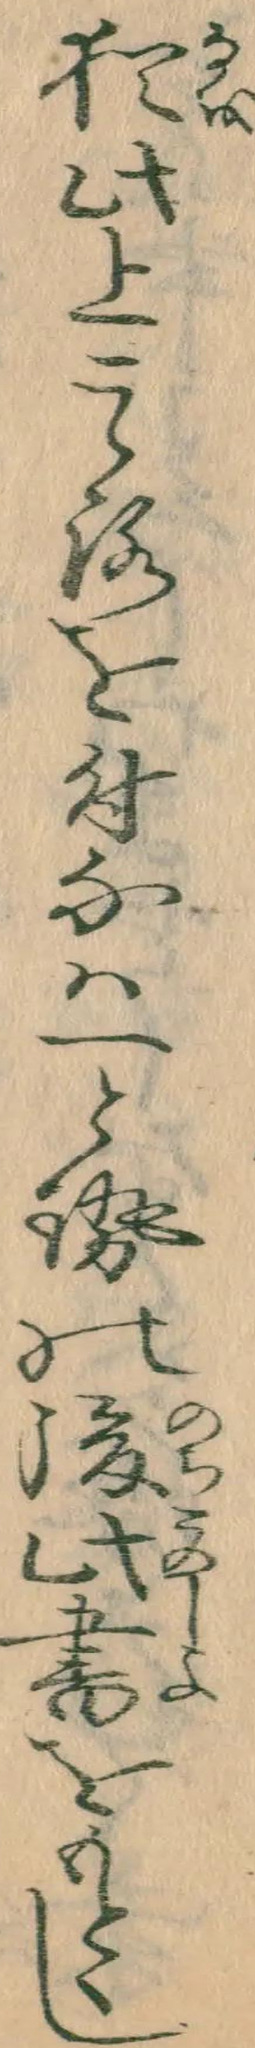猶此上こゝろを付なは一とせの後此書をもとゝし
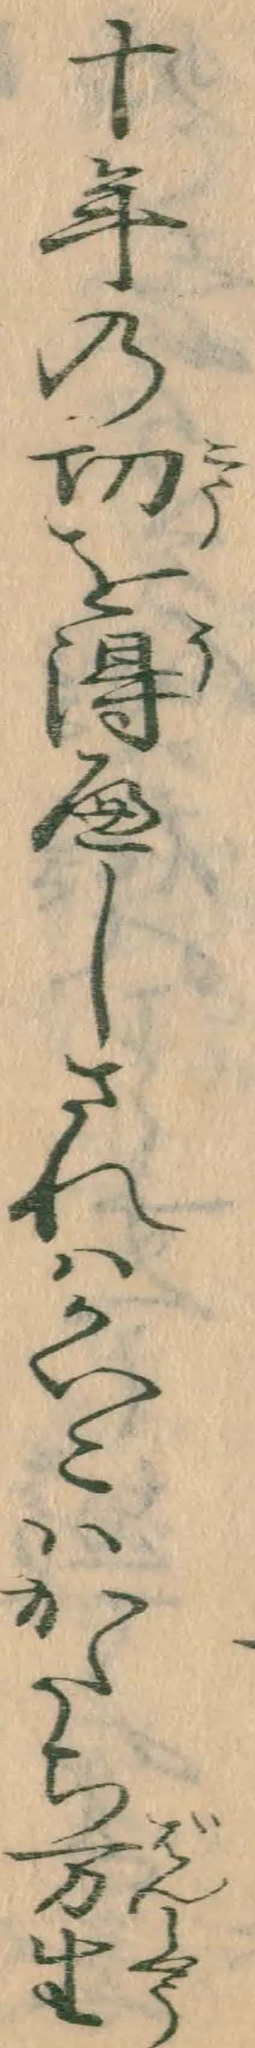十年の功を得へしされはかいこはかたち万生
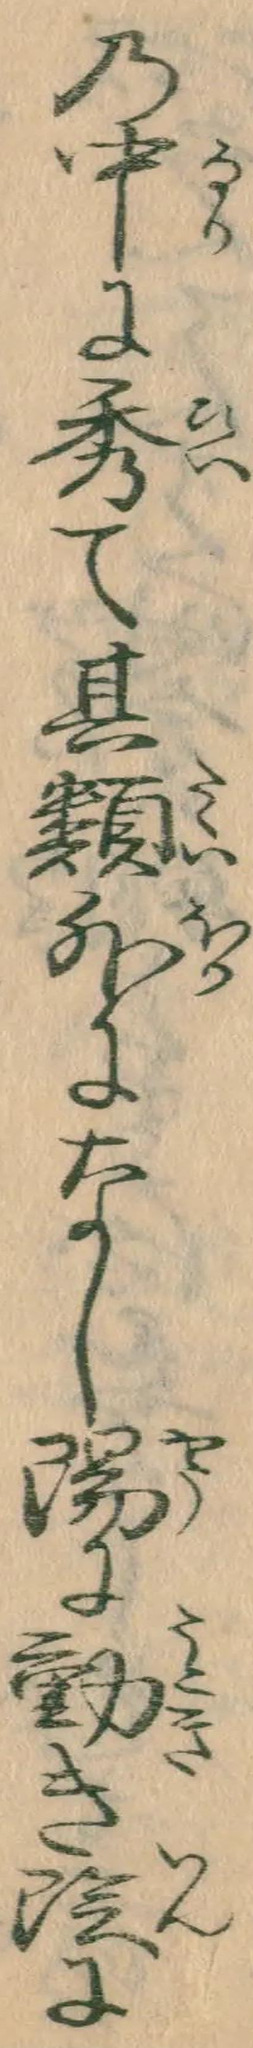の中に秀て其類外になし陽に動き陰に
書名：蚕飼養法記
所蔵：国立国会図書館 National Diet Library, JAPAN
